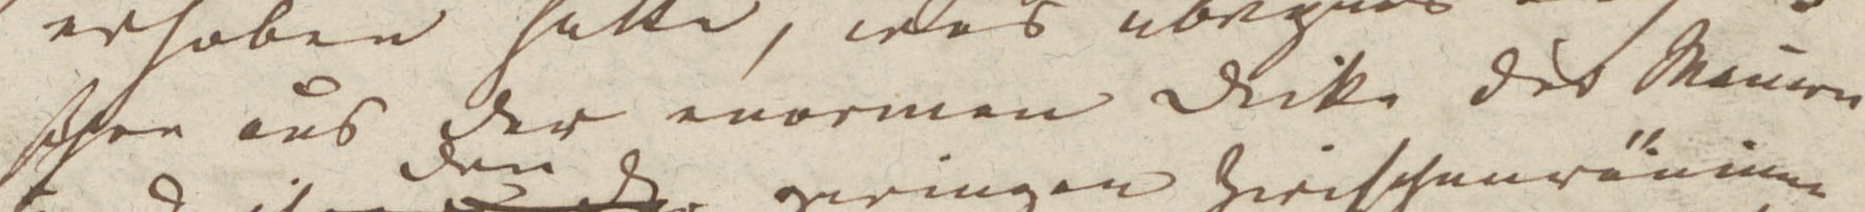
schon aus der enormen Dicke der Mauern
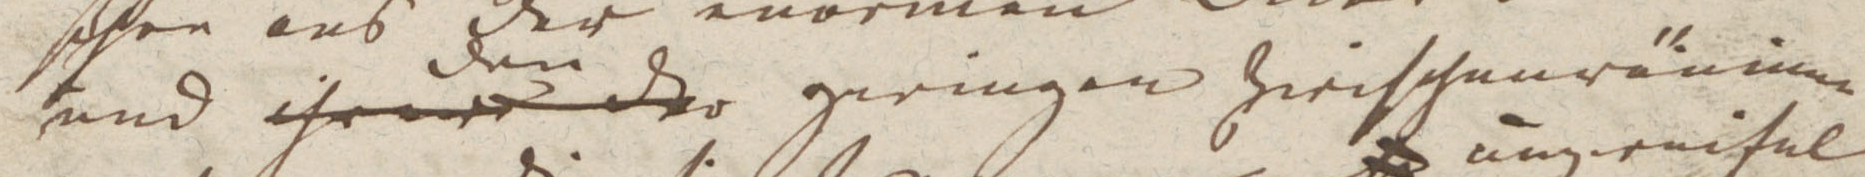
und ihrer der den geringen Zwischenräumen
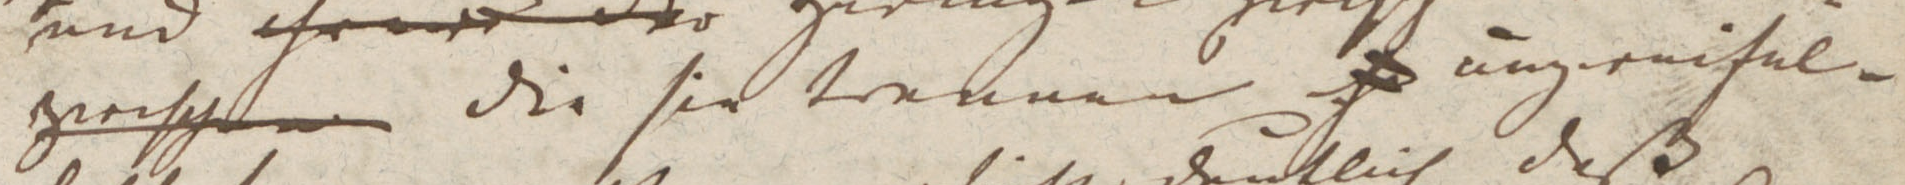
zwischen die sie trennen h unzweifel-
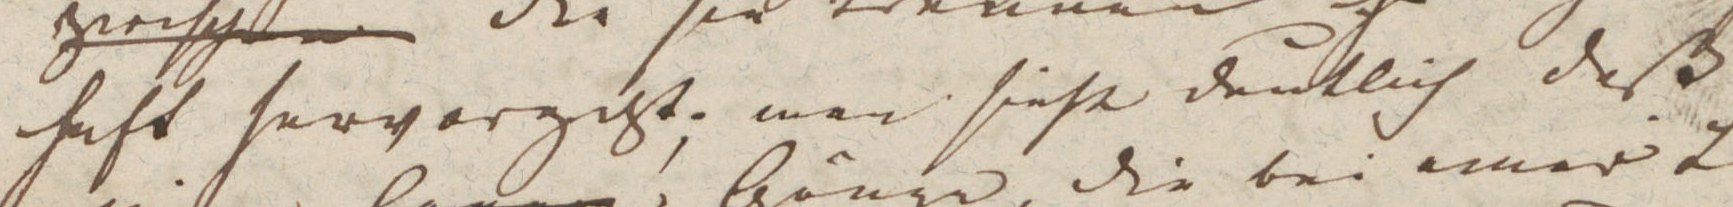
haft hervorgeht; man sieht deutlich dass
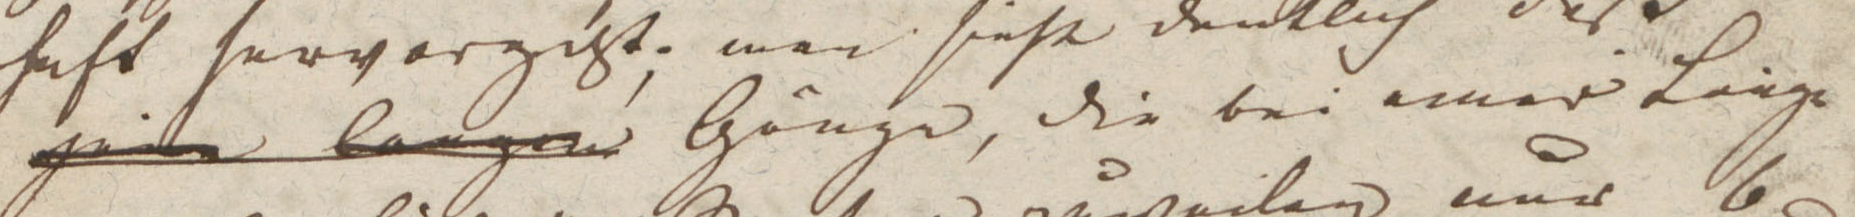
diese jene langen Gänge, die bei einer Länge
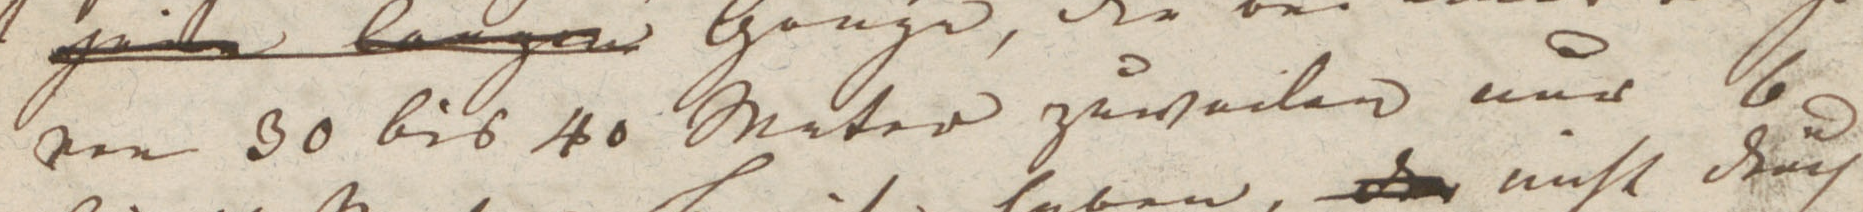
von 30 bis 40 Meter zuweilen nur 6
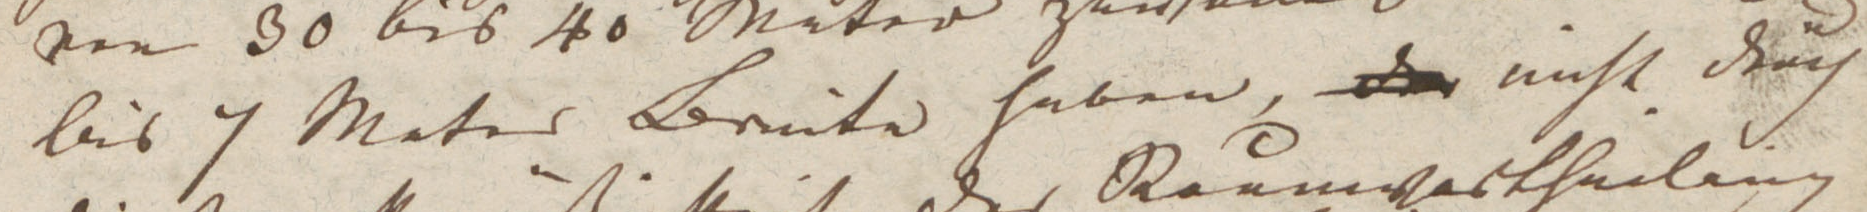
bis 7 Meter Breite haben, d nicht durch
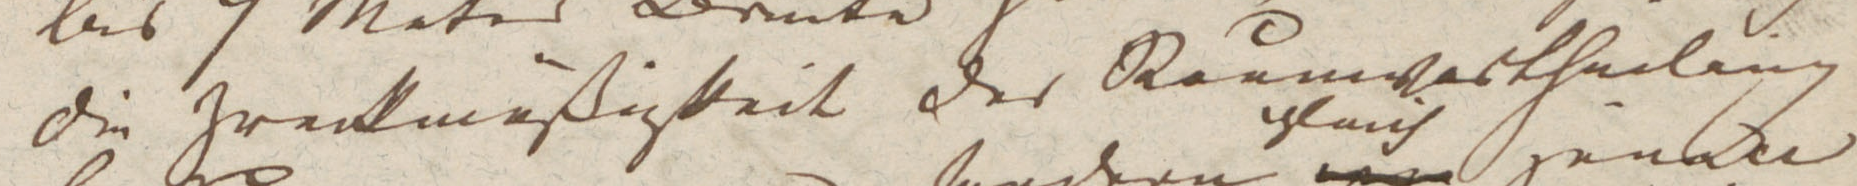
die Zweckmässigkeit der Raumvertheilung
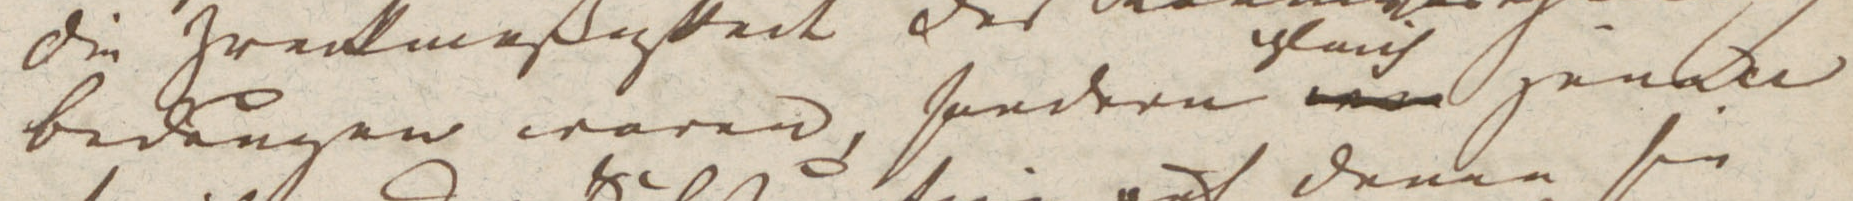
bedungen waren, sondern wie gleich jenen
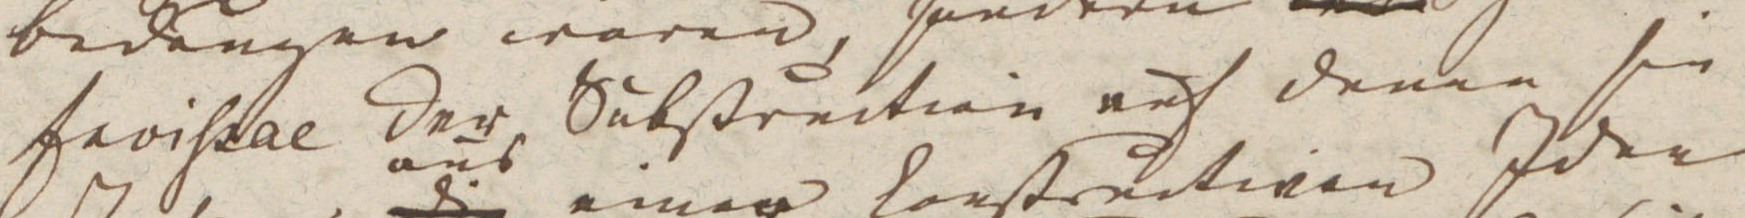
Favissae der Substruction auf denen sie
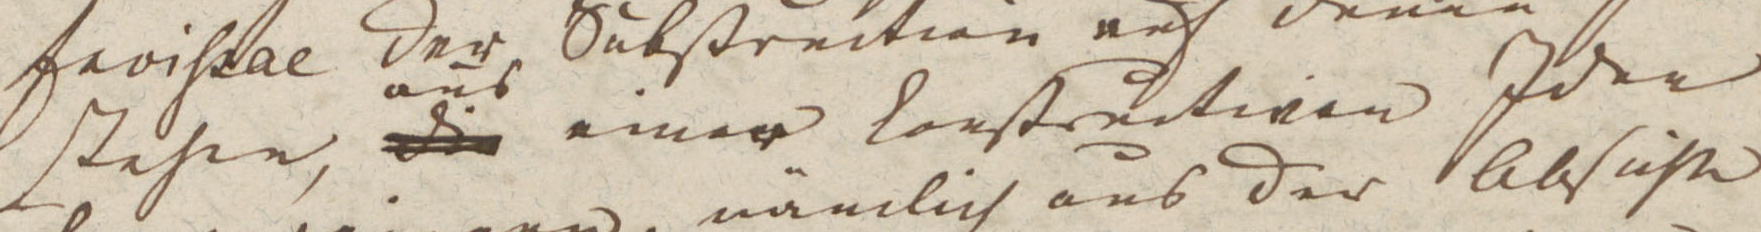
stehen, die aus einenr konstructiven Idee
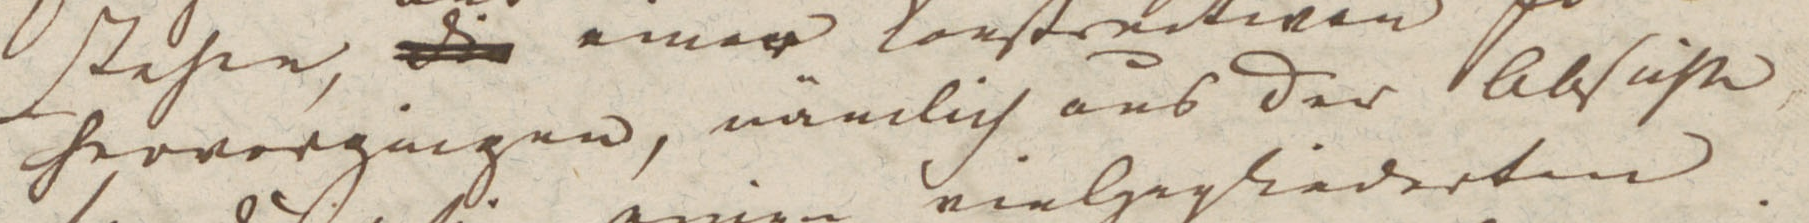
hervorgingen, nämlich aus der Absicht
